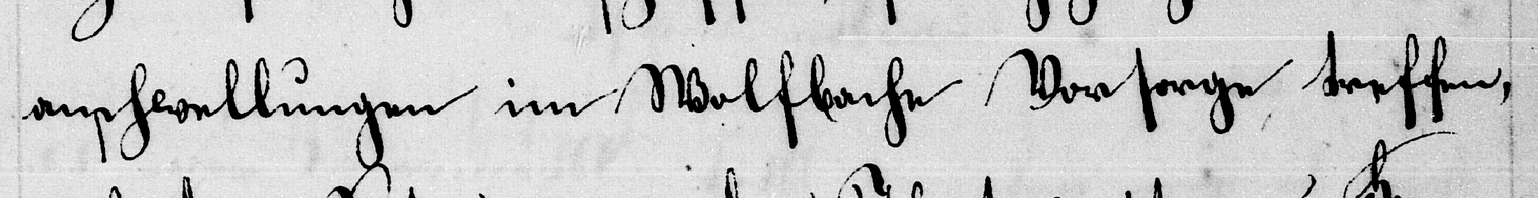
anschwellungen im Wolfbache Vorsorge treffen,
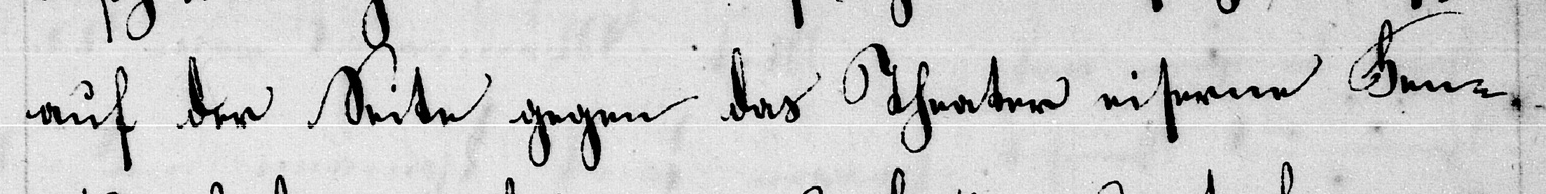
auf der Seite gegen das Theater eiserne Fens¬
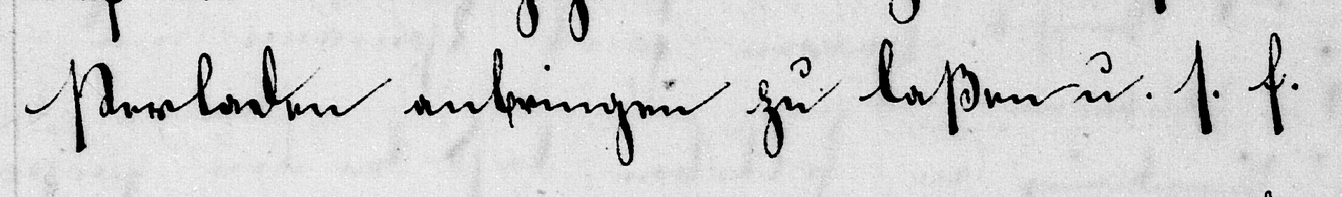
terladen anbringen zu laßen u. s. f.
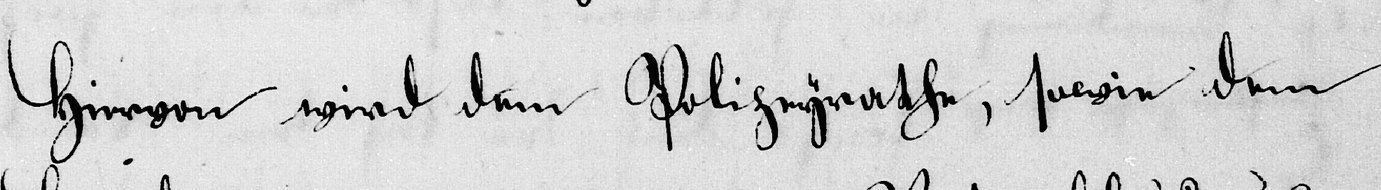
Hiervon wird dem Polizeyrathe, sowie dem
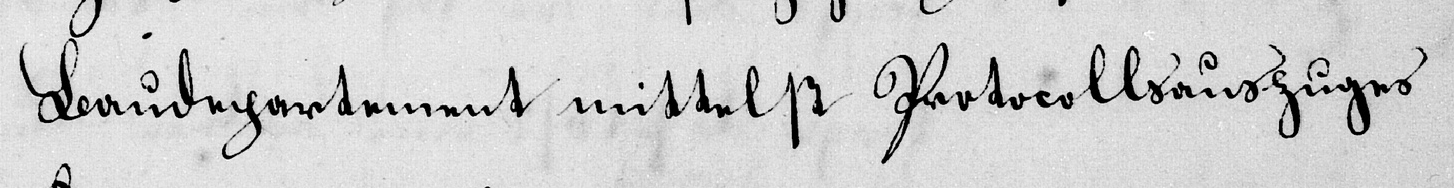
Baudepartement mittelst Protocollsauszuges
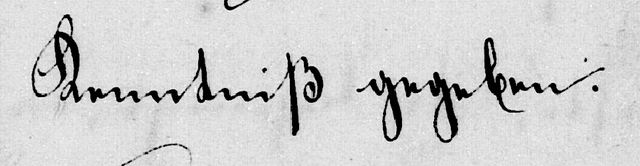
Kenntniß gegeben.
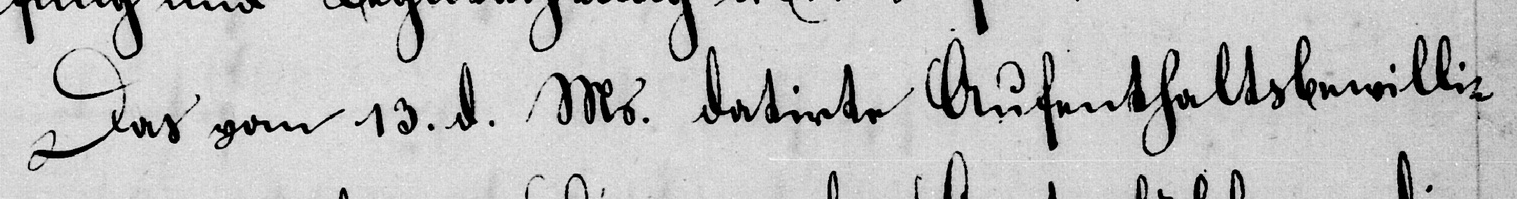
Das vom 13. d. Ms. datirte Aufenthaltsbewilli¬
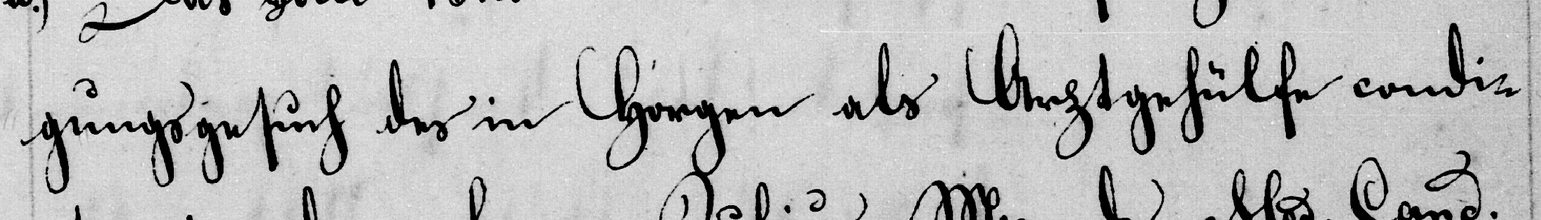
gungsgesuch des in Horgen als Arztgehülfe condi¬
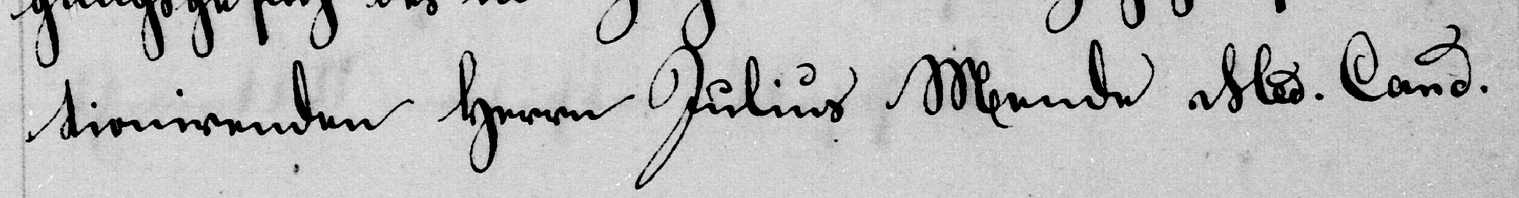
tionirenden Herrn Julius Mende Med. Cand.
